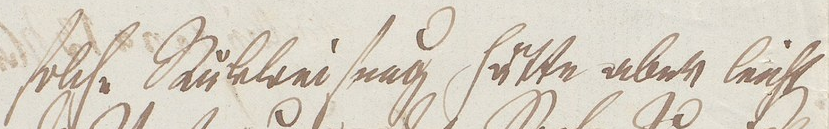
solche Rükweisung hätte aber leicht
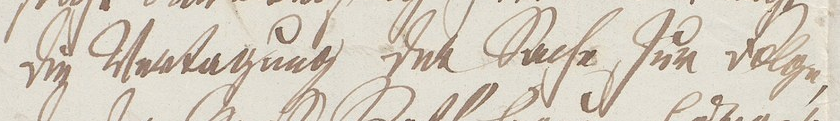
die Vertagung der Sache zur Folge,
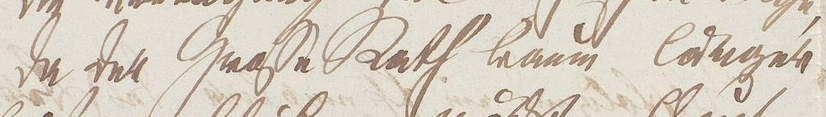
da der Grosse Rath kaum länger
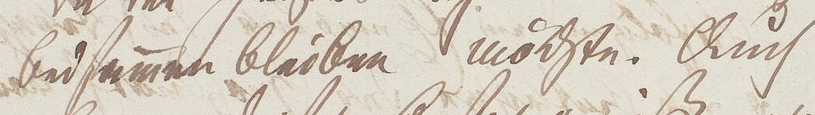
beisammen bleiben möchte. Auch
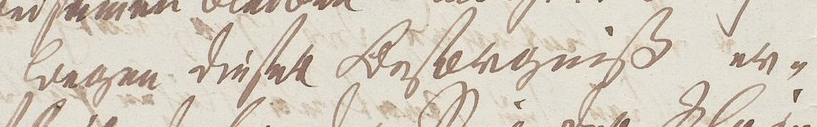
wegen dieser Besorgniß er-
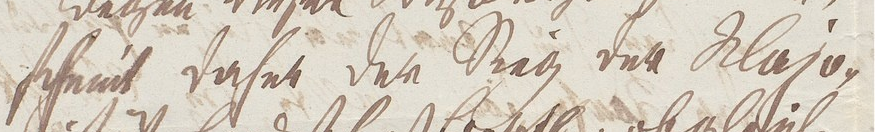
scheint daher der Sieg der Majo-
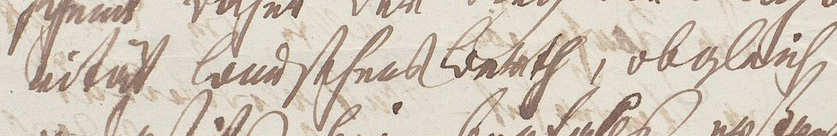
rität wünschenswerth, obgleich
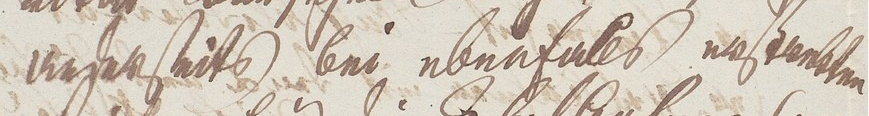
anderseits bei ebenfalls erstrekten
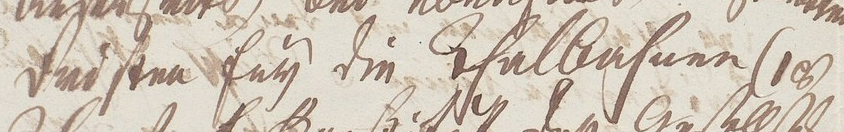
Fristen für die Thalbahnen (18
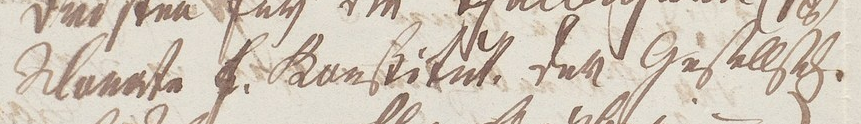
Monate f. Konstitut. der Gesellsch.
